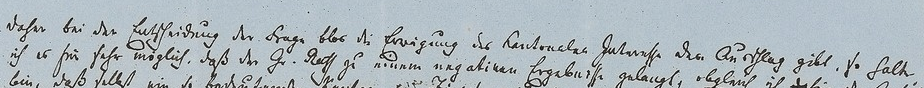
daher bei der Entscheidung der Frage blos die Erwägung des Cantonalen Interesse den Ausschlag gibt, so halte
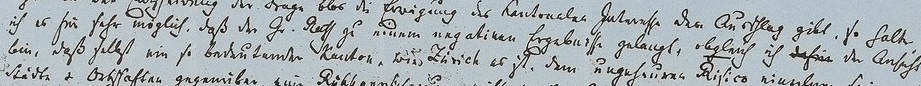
ich es für sehr möglich, daß der Gr. Rath zu einem negativen Ergebnisse gelangt, obgleich ich der Ansicht
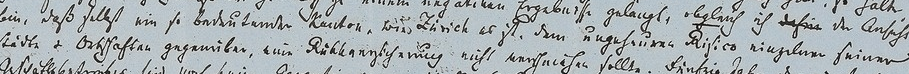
bin, daß selbst ein so bedeutender Kanton, wie Zürich es ist, dem ungeheuren Risico einzelner seiner
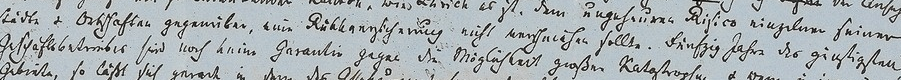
Städte & Ortschaften gegenüber, eine Rükkversicherung nicht verschmähen sollte. Fünfzig Jahre des günstigsten
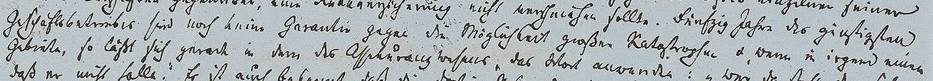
Geschäftsbetriebes sind noch keine Garantie gegen die Möglichkeit großer Katastrophen &, wenn in irgend einem
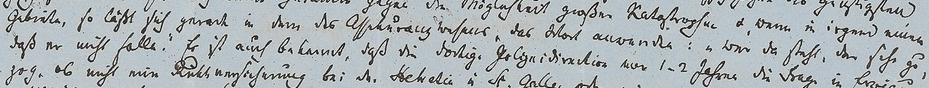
Gebiete, so läßt sich gerade in dem des Assekuranzwesens, das Wort anwenden: «wer da steht, der sehe zu,
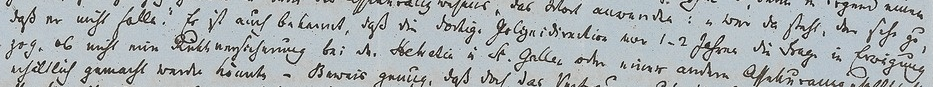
daß er nicht falle.» Es ist auch bekannt, daß die dortige Polizeidirection vor 1–2 Jahren die Frage in Erwägung
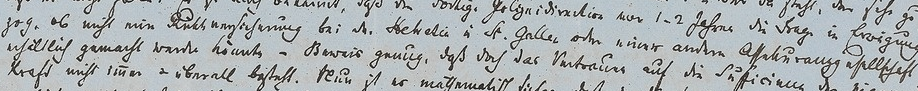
zog, ob nicht eine Rükkversicherung bei der Helvetia in St.Gallen oder einer andern Assekuranzgesellschaft
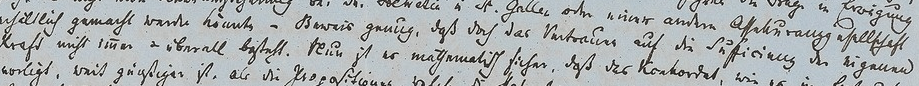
erhältlich gemacht werden könnte ­ Beweis genug, daß doch das Vertrauen auf die Sufficienz der eigenen
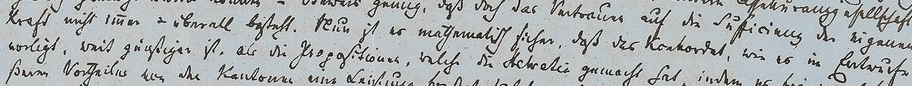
Kraft nicht immer & überall besteht. Nun ist es mathematisch sicher, daß das Konkordat, wie es im Entwurfe
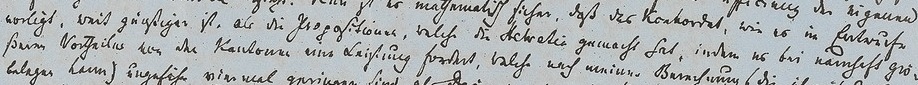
vorliegt, weit günstiger ist, als die Propositionen, welche die Helvetia gemacht hat, indem es bei namhaft grö-
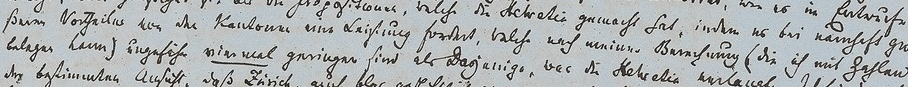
ßeren Vortheilen von den Kantonen eine Leistung fordert, welche nach meiner Berechnung (die ich mit Zahlen
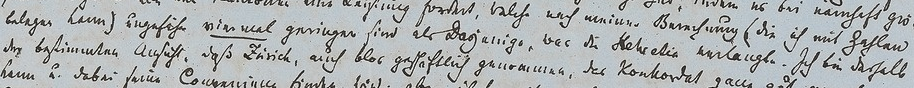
belegen kann) ungefähr viermal geringer sind als Dasjenige, was die Helvetia verlangte. Ich bin deshalb
